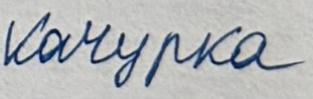качурка
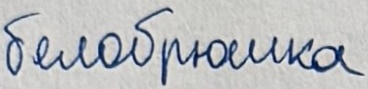белобрюшка
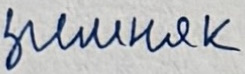зимняк
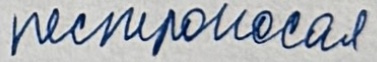пестроносая
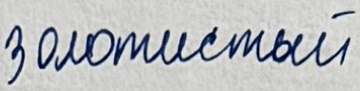золотистый
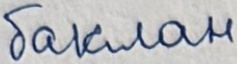баклан
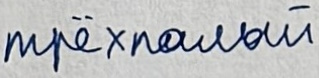трёхпалый
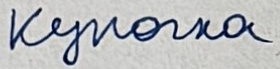купочка
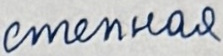степная
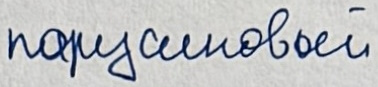парусиновый
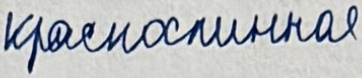красноспинная
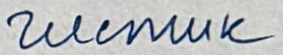чистик
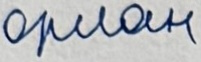орлан
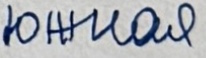южная
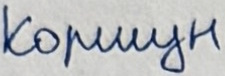коршун
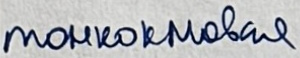тонкоклювая
